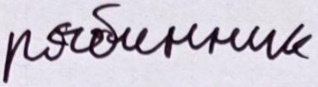рябинник
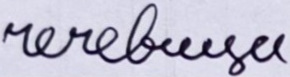чечевица
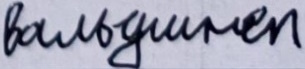вальдшнеп
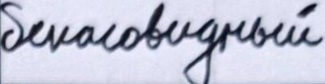бекасовидный
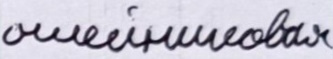ошейниковая
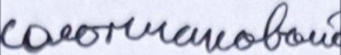солончаковый
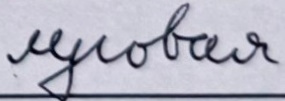луговая
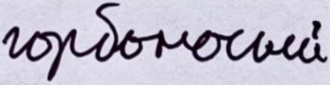горбоносый
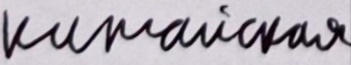китайская
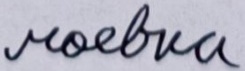моевка
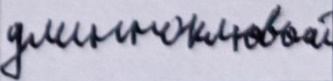длинноклювый
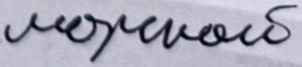морской
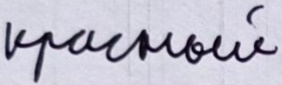красный
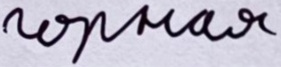горная
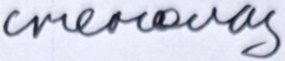стенолаз
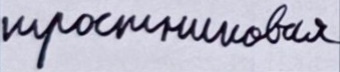тростниковая
